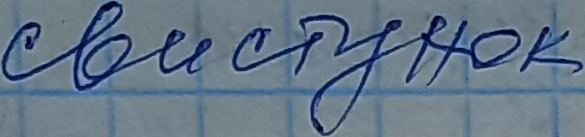свистунок
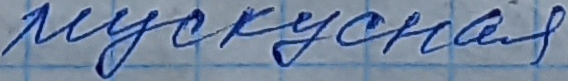мускусная
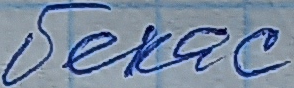бекас
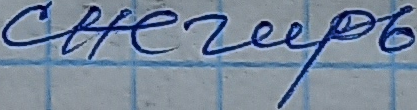снегирь
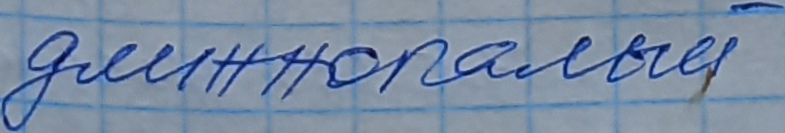длиннопалый
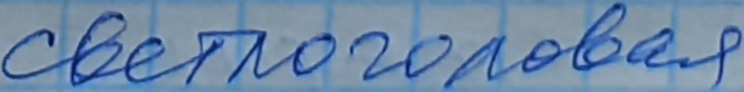светлоголовая
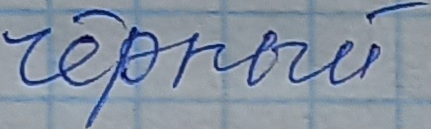чёрный
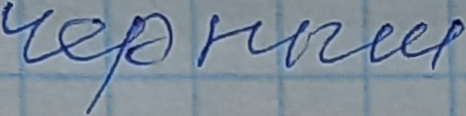черныш
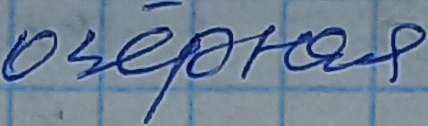озёрная
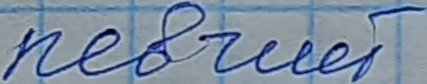певчий
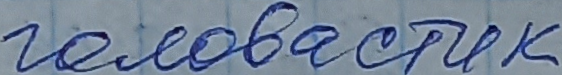головастик
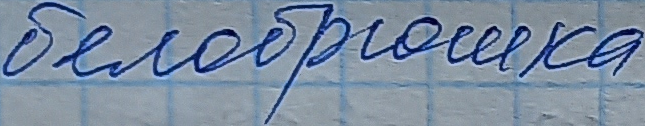белобрюшка
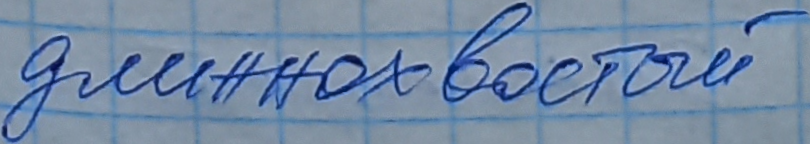длиннохвостый
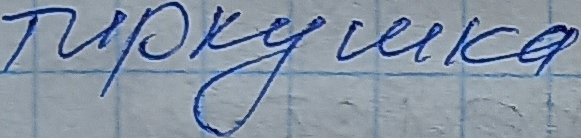тиркушка
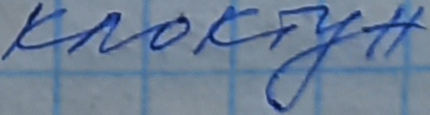клоктун
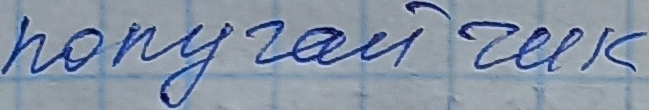попугайчик
